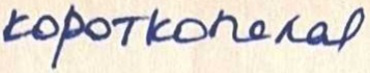короткополая
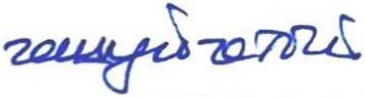чешуйчатый
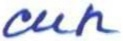сип
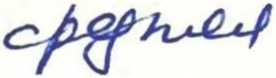средняя
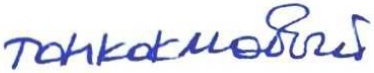тонкоклювый
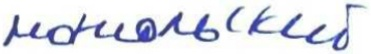монгольский
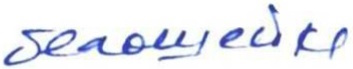белошейка
